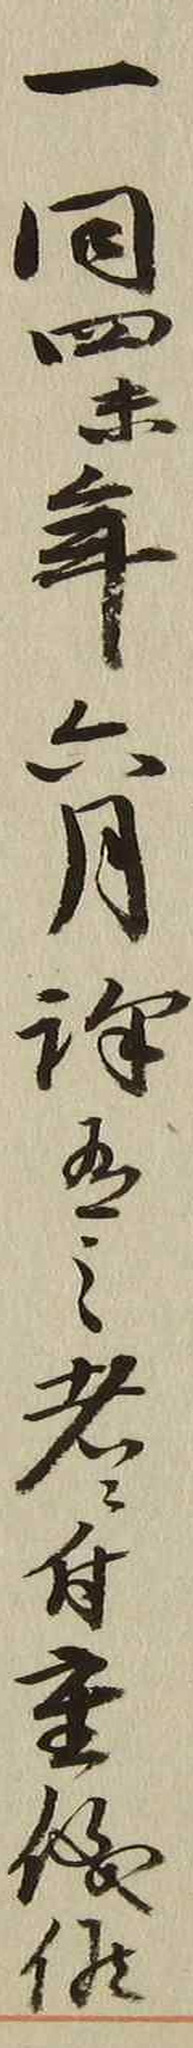一同四未年六月訳有之者ニ付重儀候
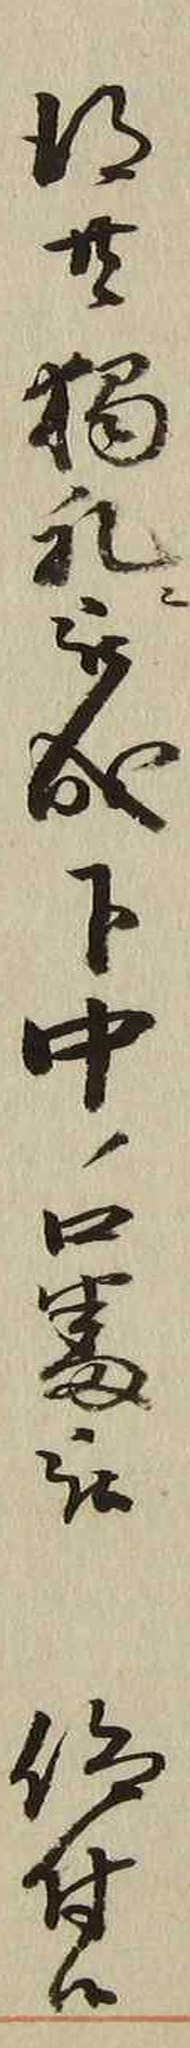得共独礼ニ被成下中ノ口番被仰付候
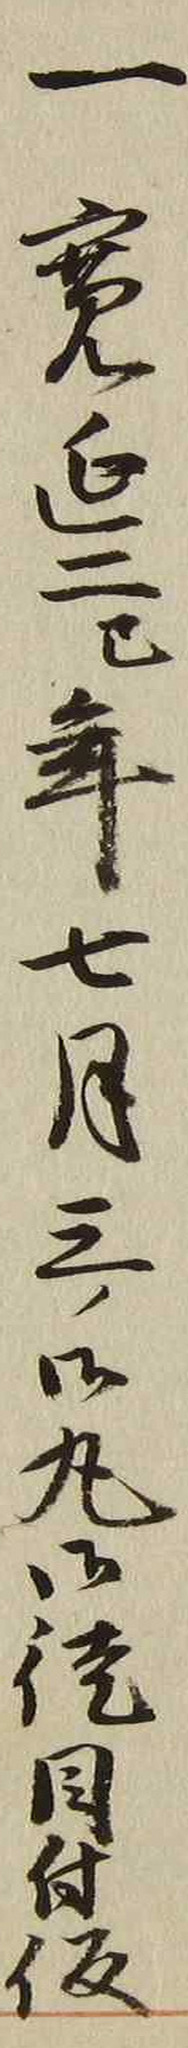一寛延二巳年七月三ノ御丸御徒目付仮
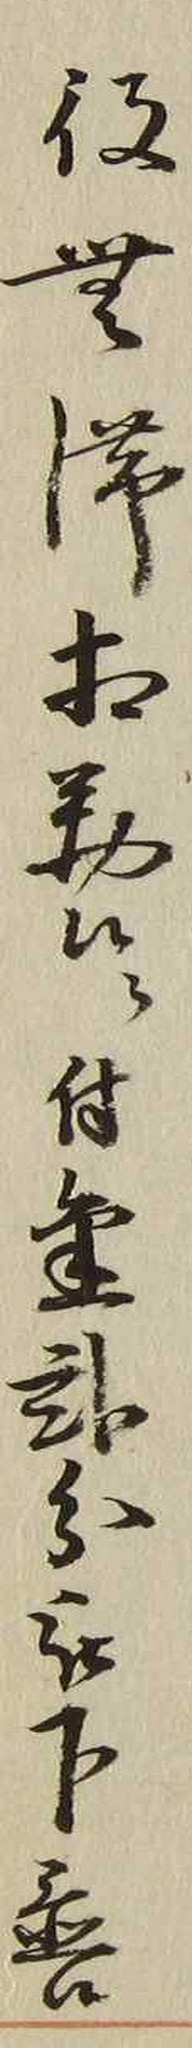役無滞相勤候ニ付金弐分被下置候
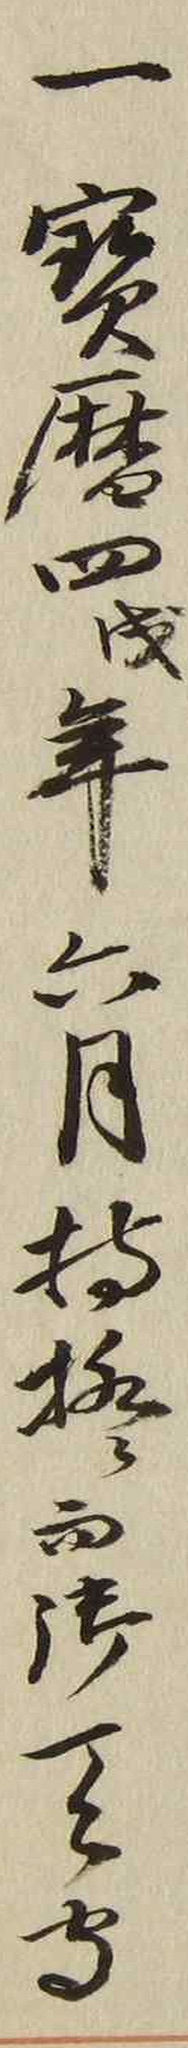一宝暦四戌年六月持格ニ而御天守

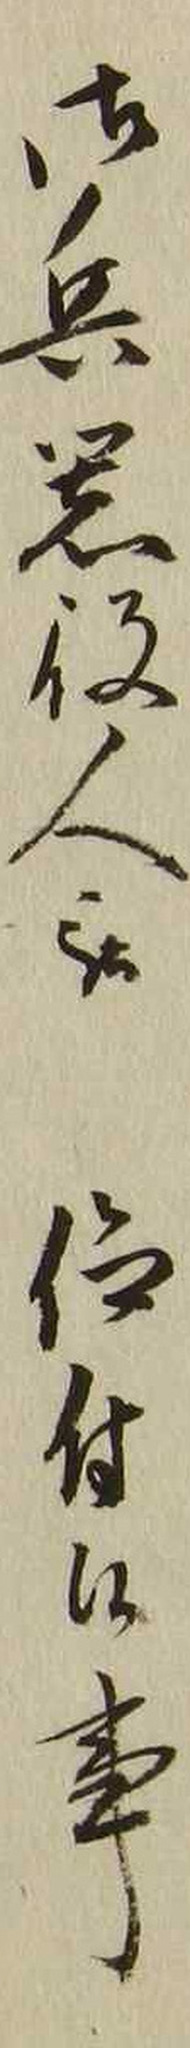御兵器役人被仰付候事
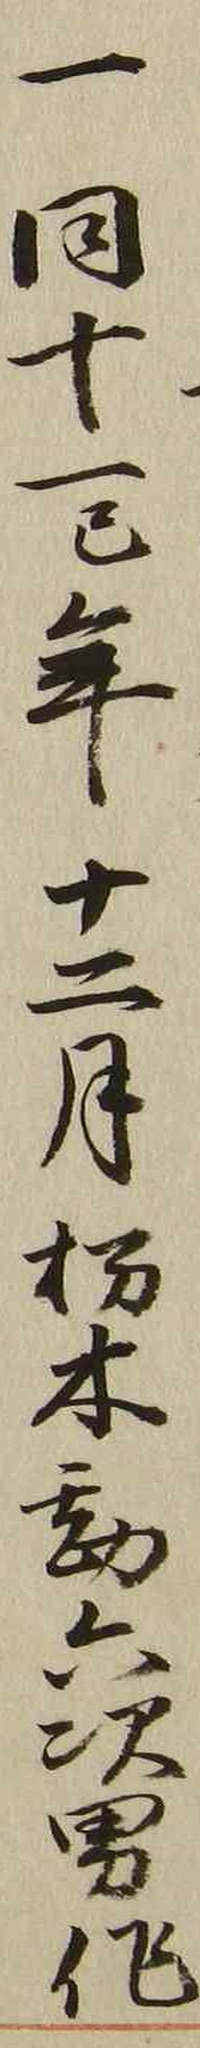一同十一巳年十二月栃木勘六次男作
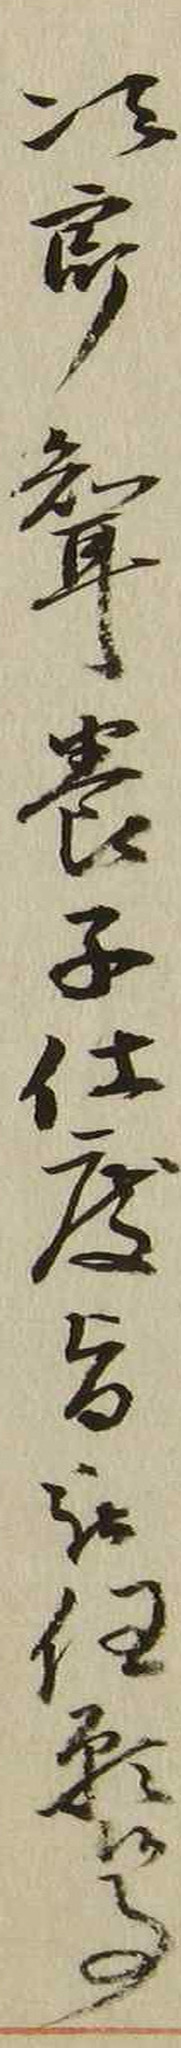次郎婿養子仕度旨被任願候事
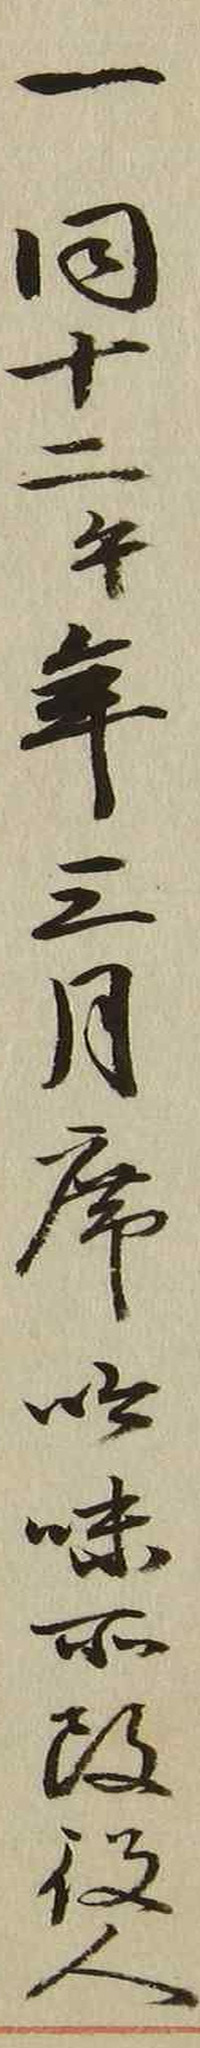一同十二午年三月席吟味所改役人
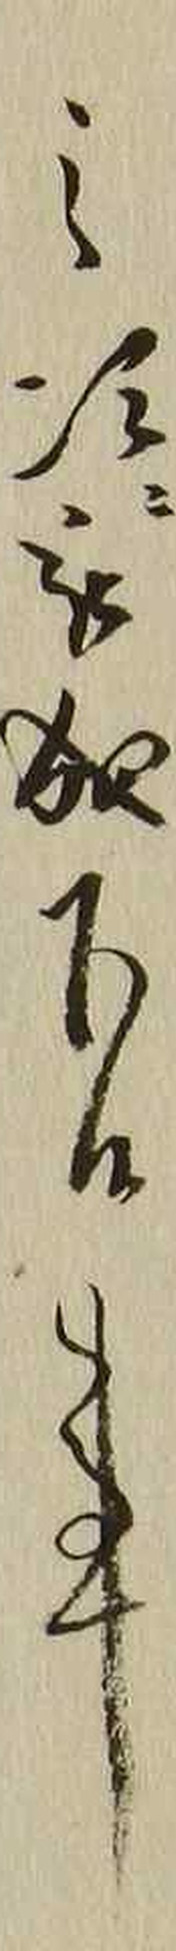之次ニ被成下候事
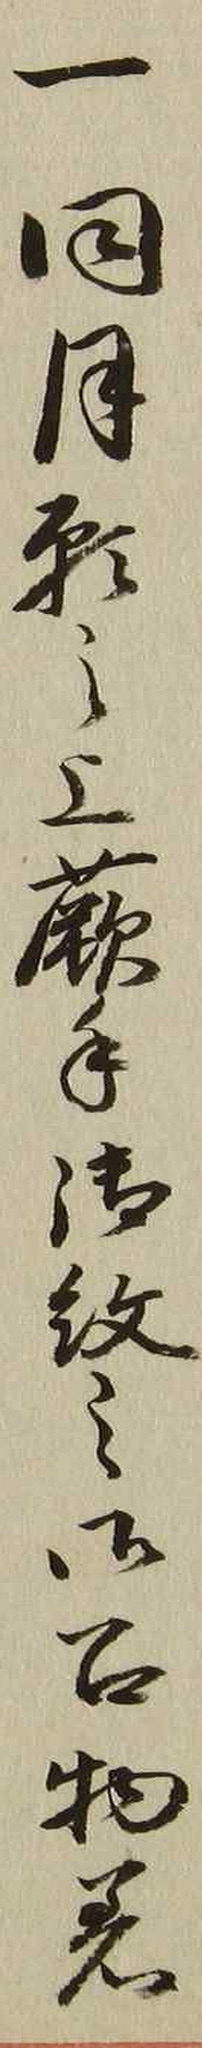一同月願之上蕨手御紋之御召物着
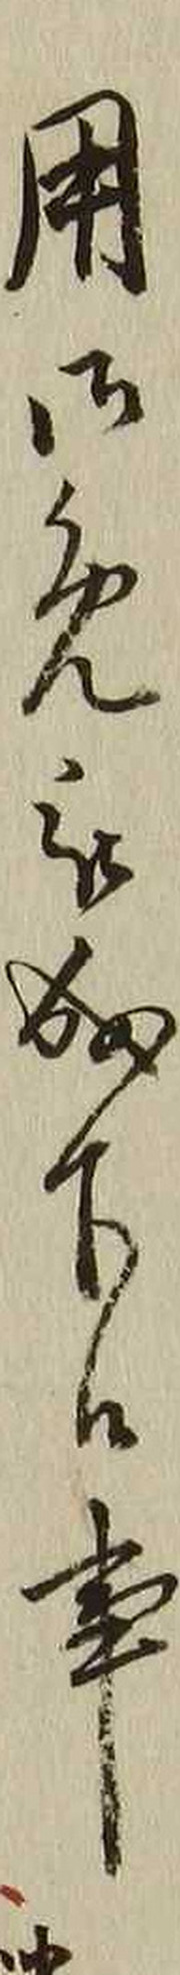用御免被成下候事
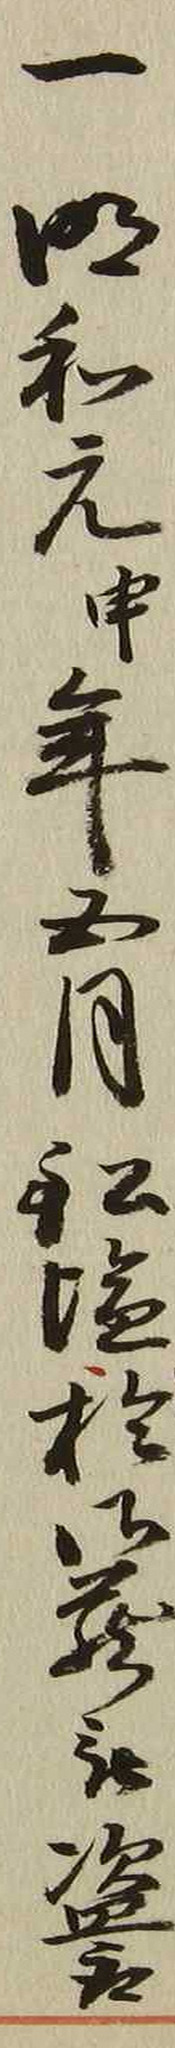一明和元申年五月鉛塩焔於御蔵被盗取
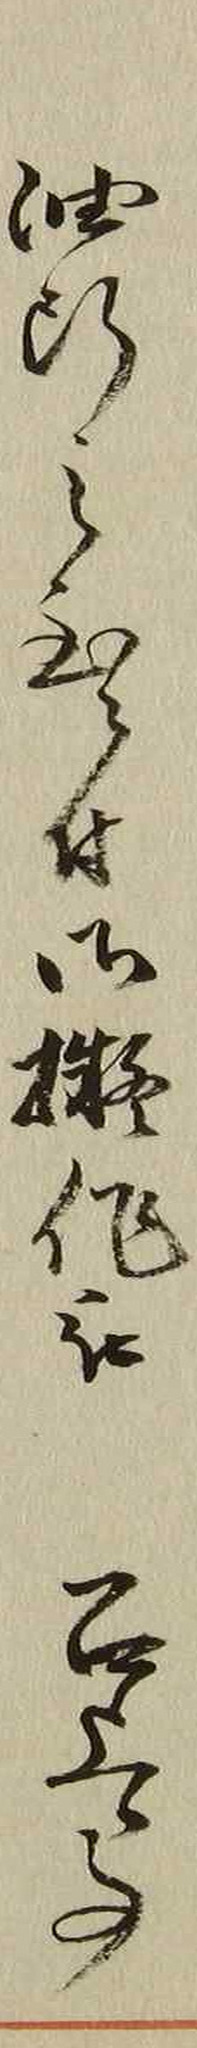油断之至ニ付御擬作被召上候事
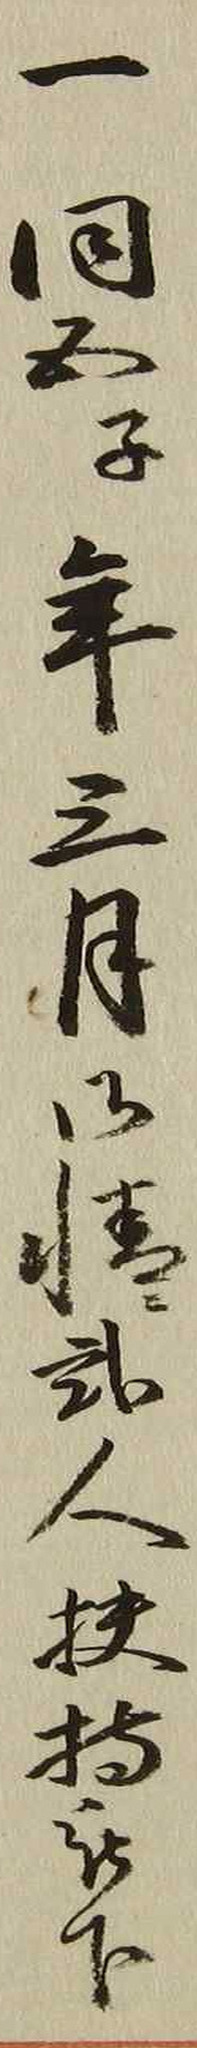一同五子年三月御情ニ弐人扶持被下
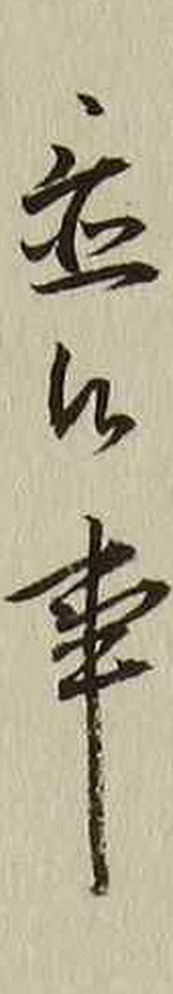置候事
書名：諸士系譜　巻之61　と之部4
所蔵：会津若松市立会津図書館
